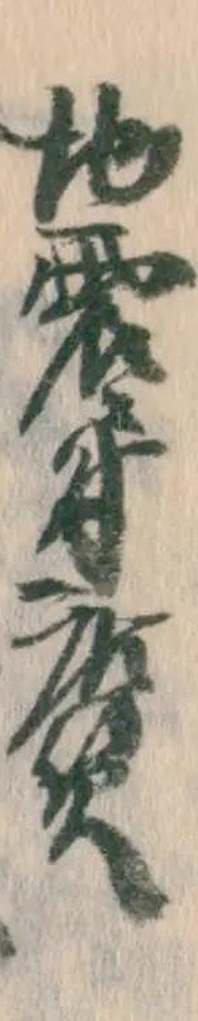地震ニ付店賃
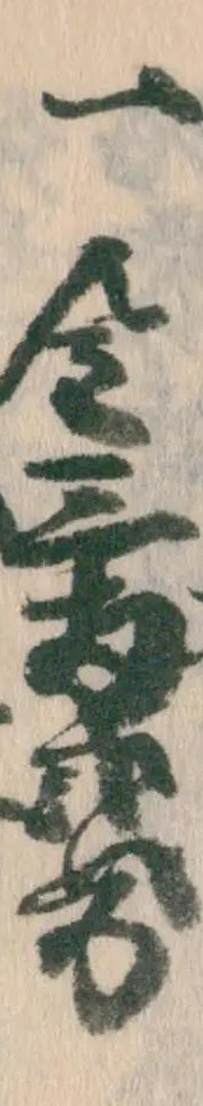一金三分弐朱

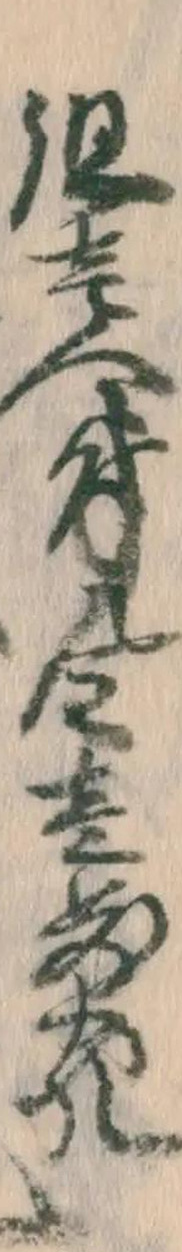但壱人ニ付金壱歩宛
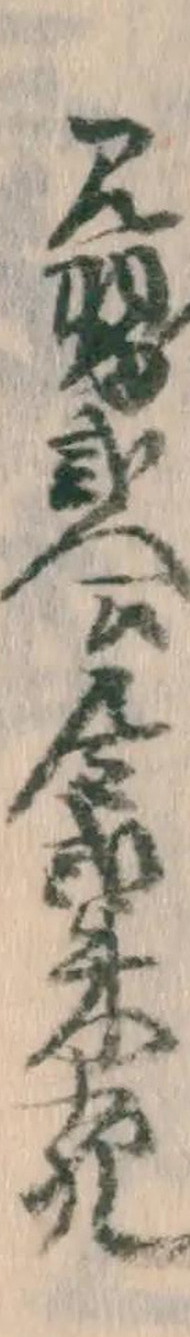見習弐人え金弐朱宛
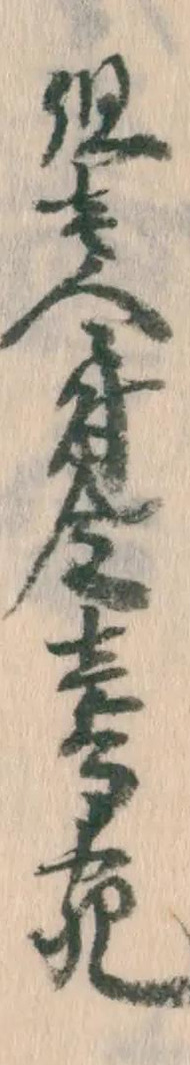但壱人ニ付金壱歩宛
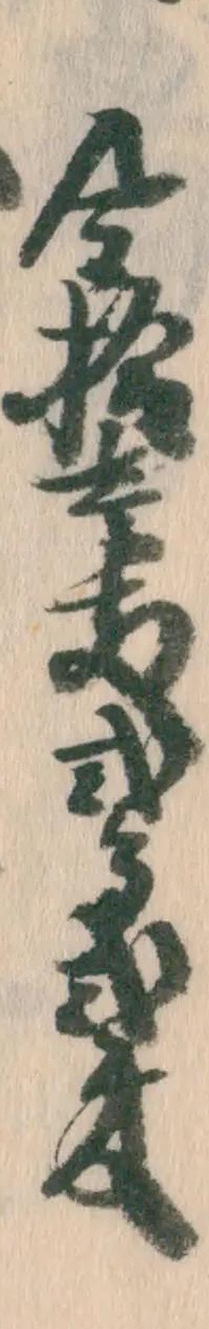〆金拾壱両弐分弐朱
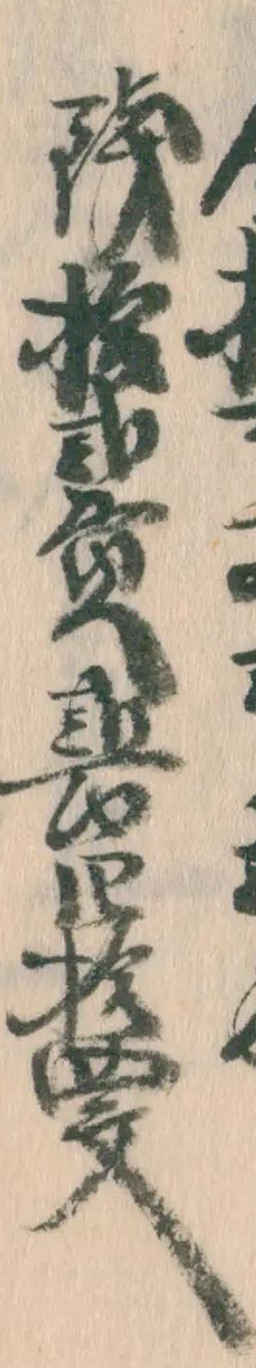銭拾弐貫弐百四拾四文

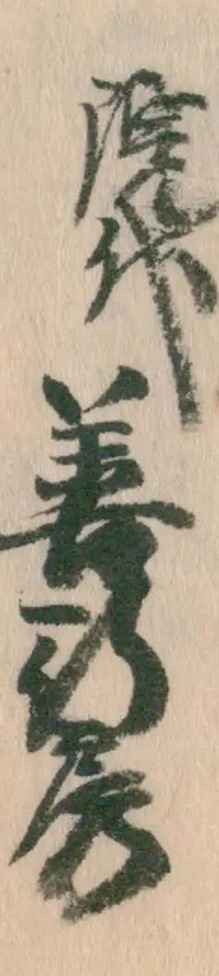院代善行房
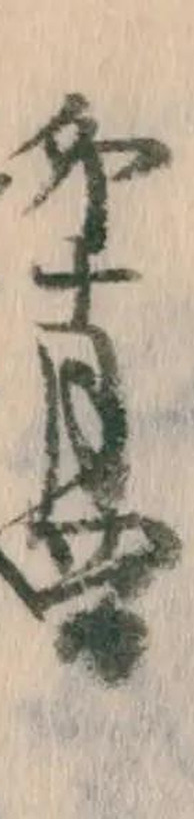卯十月四日
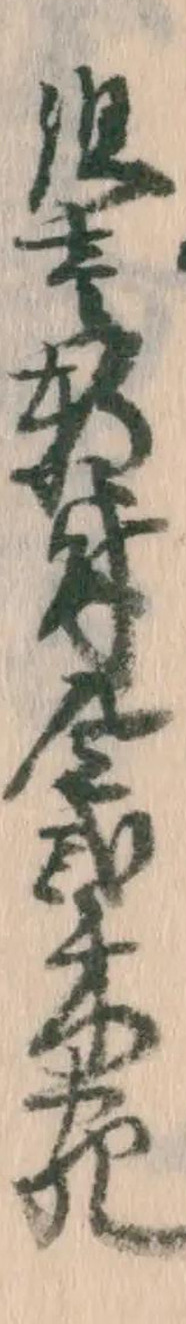但壱軒ニ付金弐朱宛
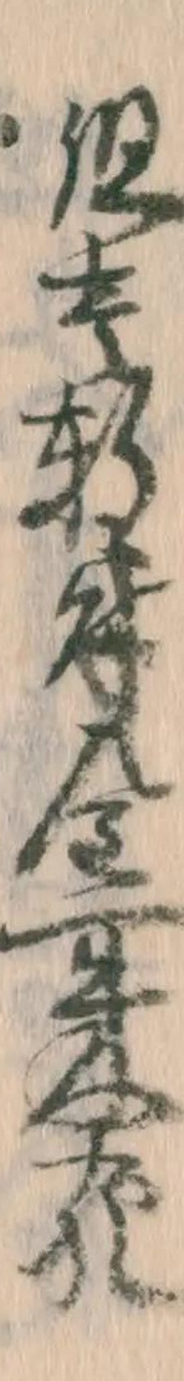但壱軒ニ付金弐朱宛
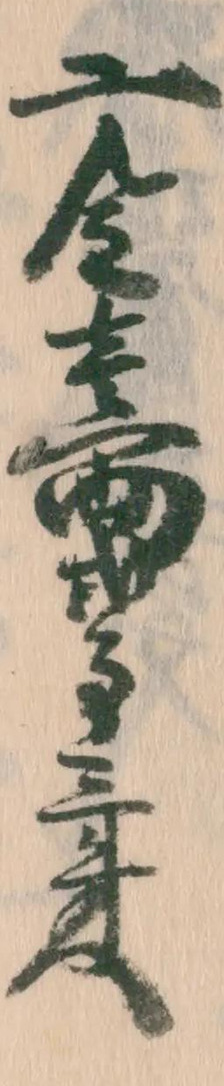〆金壱両弐分三朱
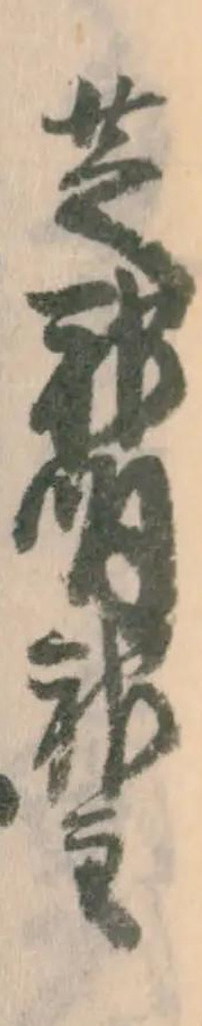芝神明神主
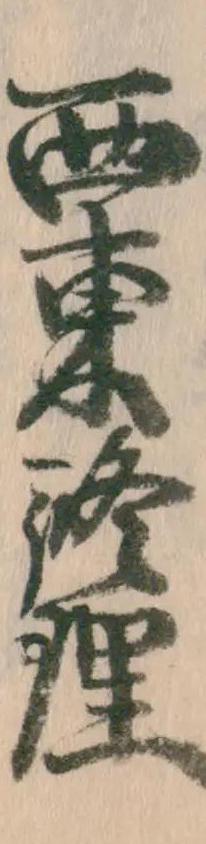西東修理
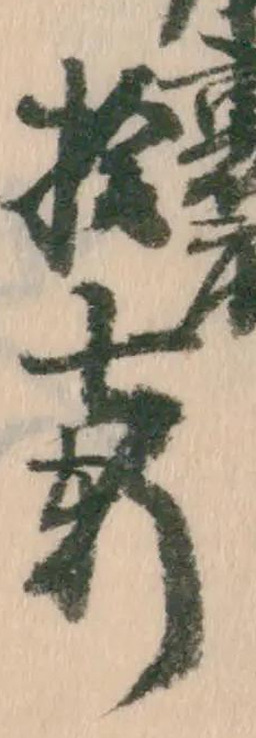拾七軒
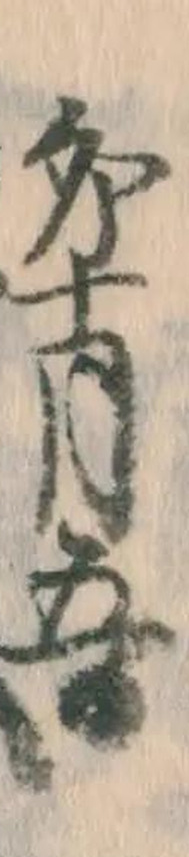卯十月五日
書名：武家方并寺院等ニテ施差出候一件
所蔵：国立国会図書館 National Diet Library, JAPAN
